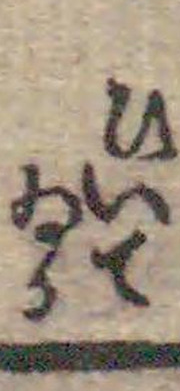ひいて
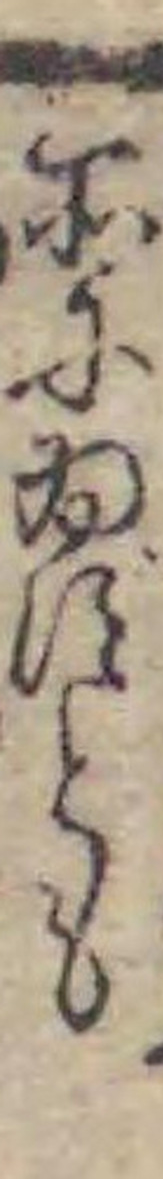所にゐずとも
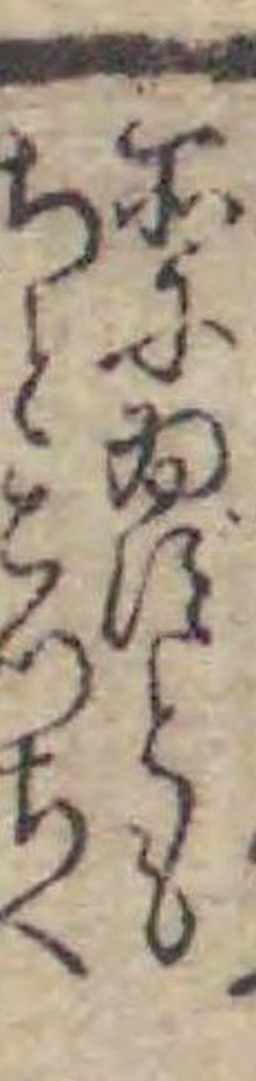ちとこつちへ
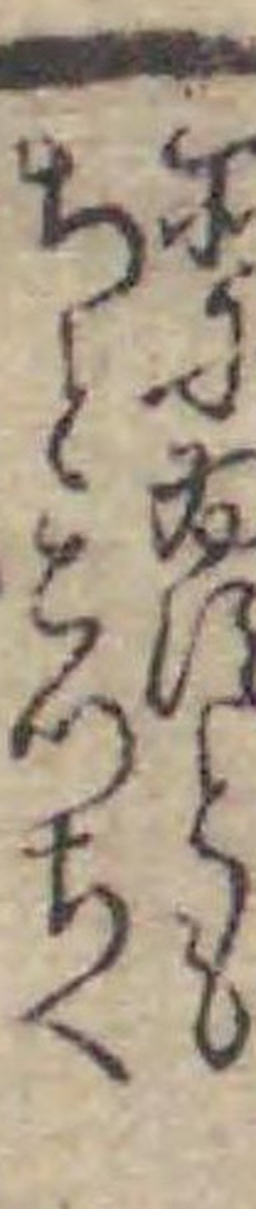ちとこつちへ
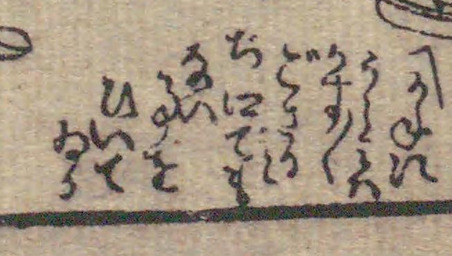ひいて
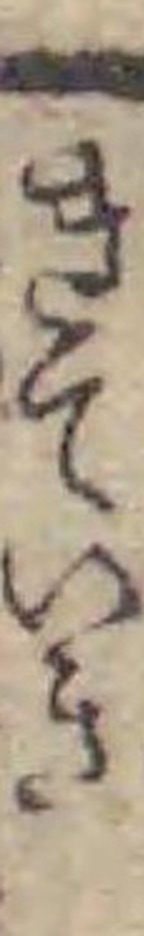きていき
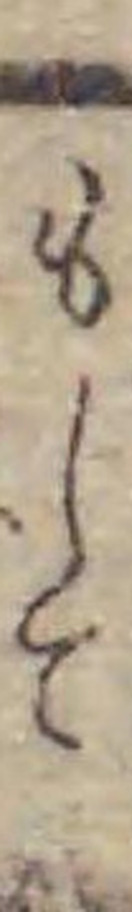もして
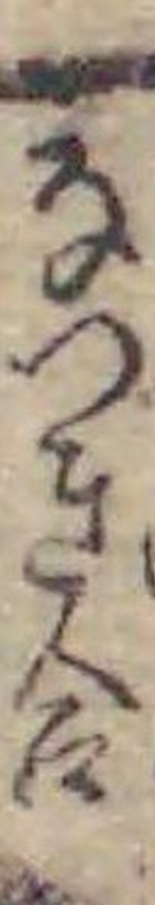なつき合
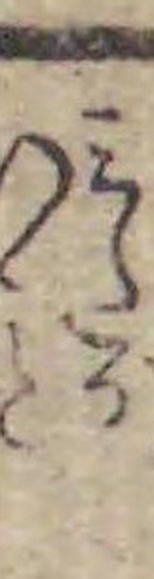みたが
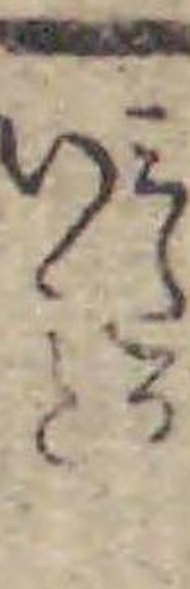いゝと
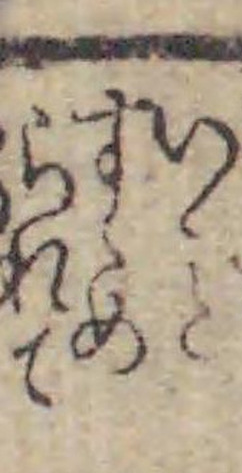すゝめ
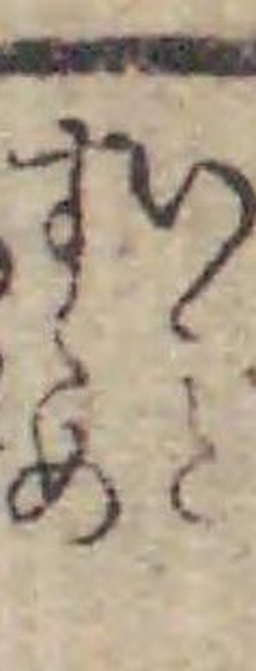すゝめ
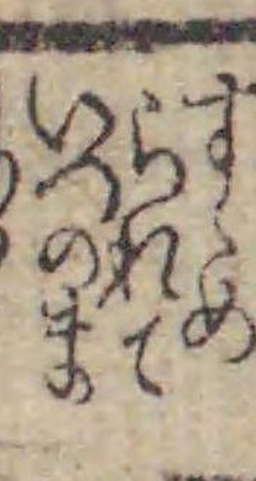いつのま
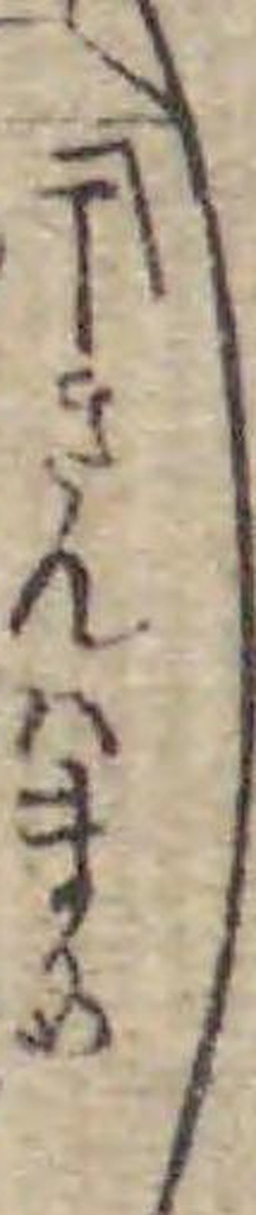〽丁きんはまめ
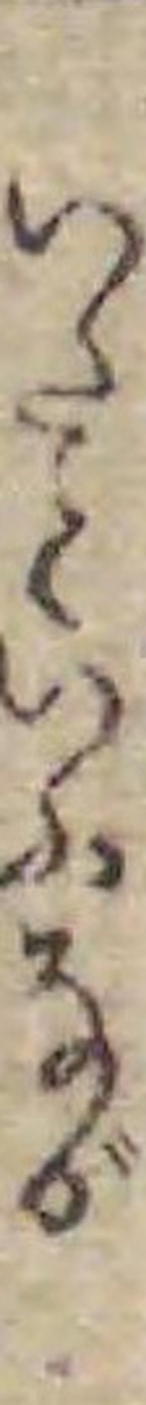いたといふなが
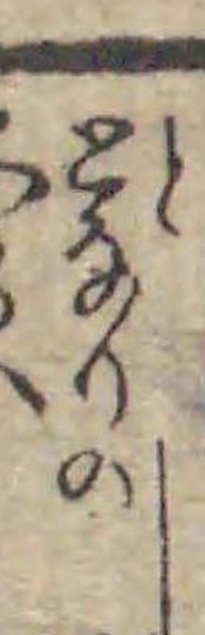となりの
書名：新鋳小判 : 3巻
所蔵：国立国会図書館 National Diet Library, JAPAN
